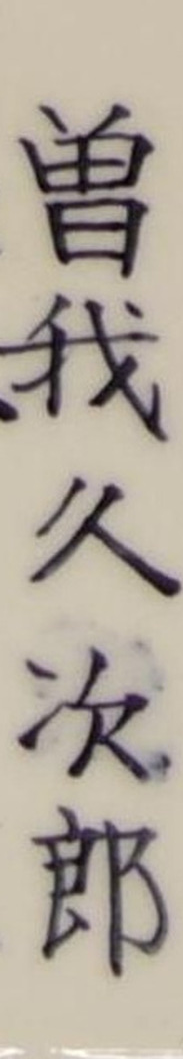曽我久次郎
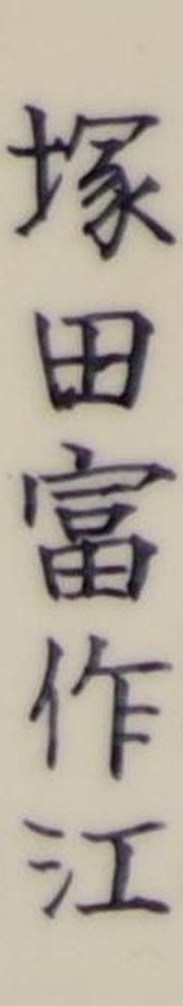塚田冨作江
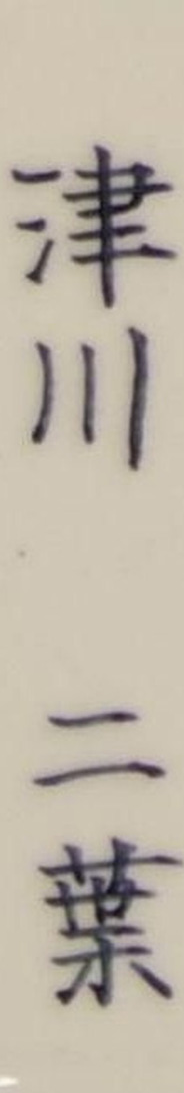津川二葉
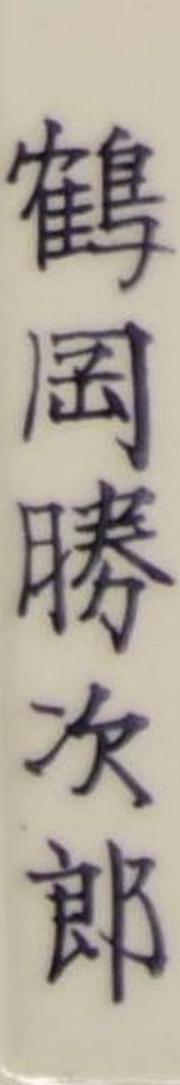鶴岡勝次郎

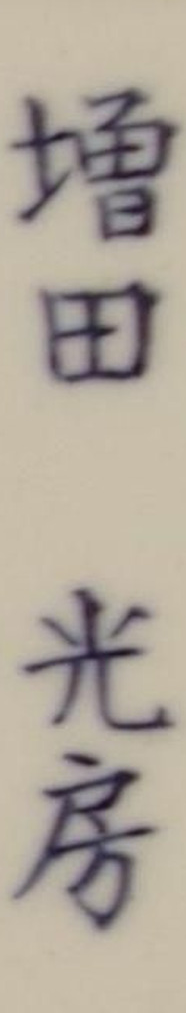増田光房
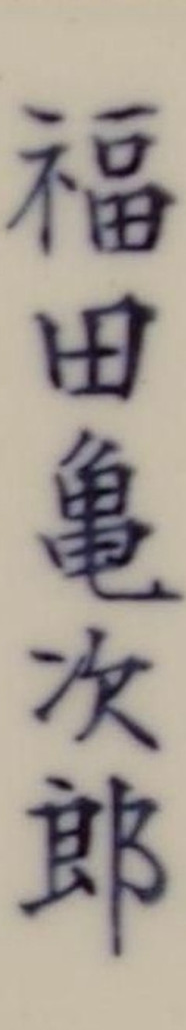福田亀次郎
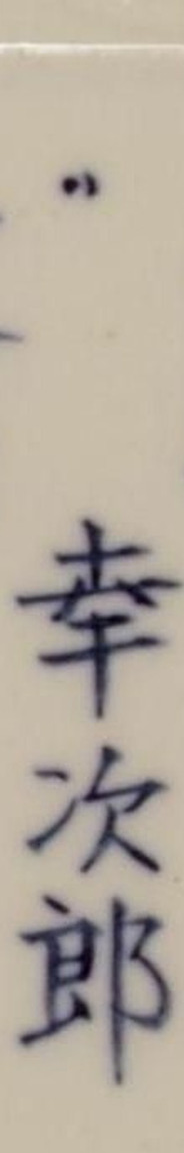幸次郎
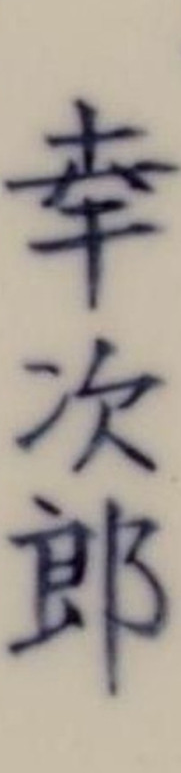幸次郎
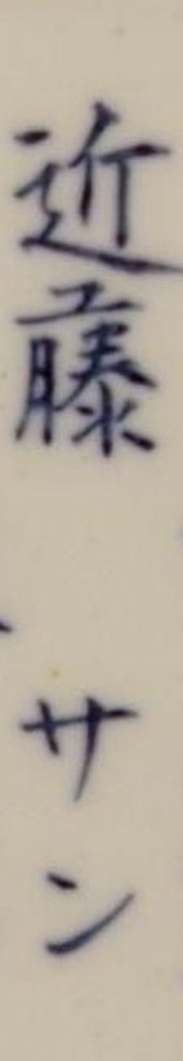近藤サン
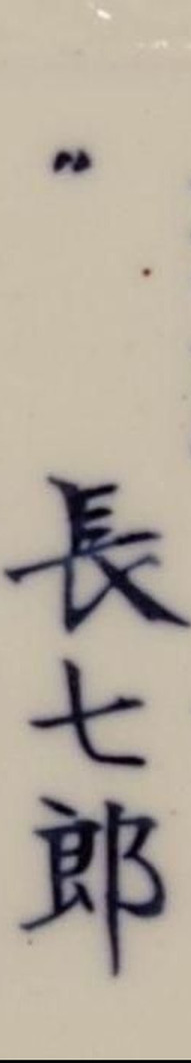長七郎
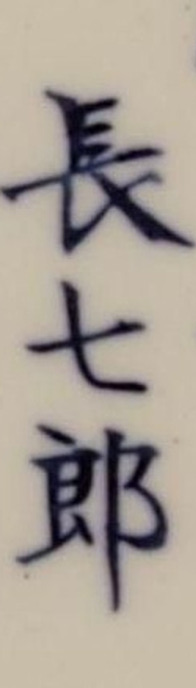長七郎
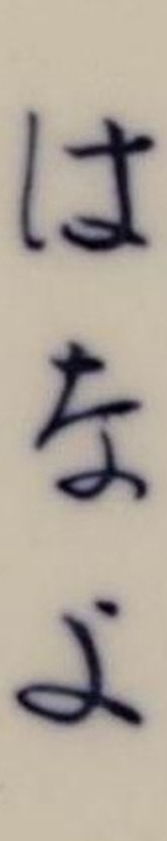はなよ
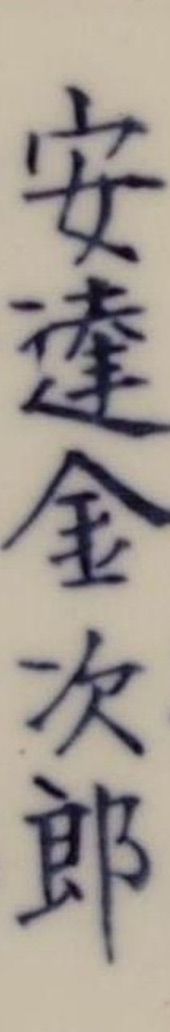安達金次郎
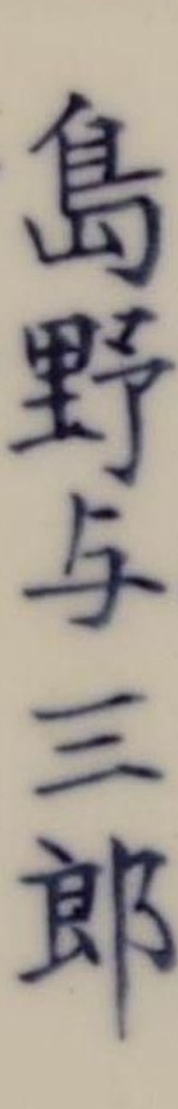島野与三郎
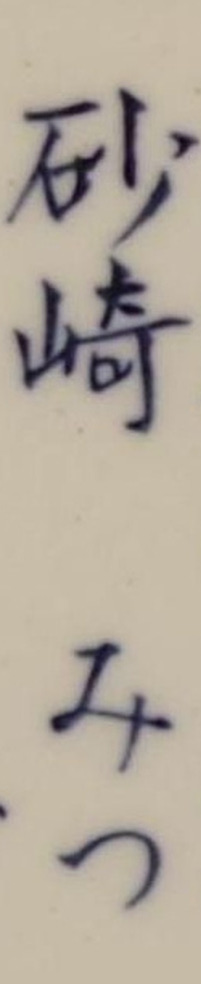砂崎みつ

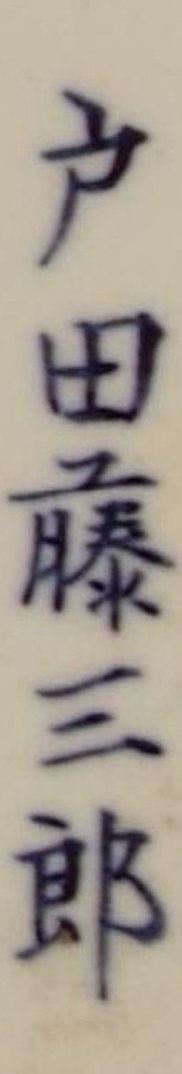戸田藤三郎
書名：E~L
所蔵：高野山金剛峯寺
